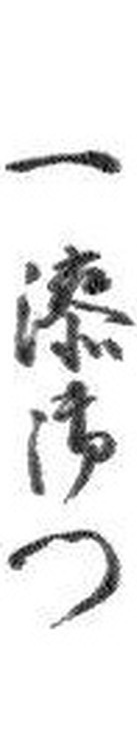一漆御門
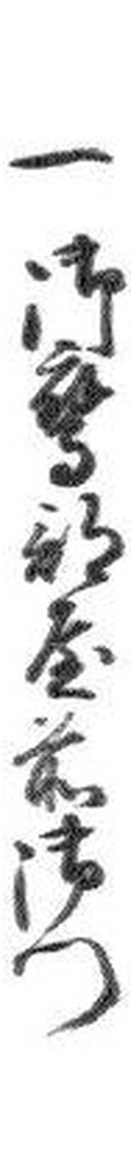一御鷹部屋前御門
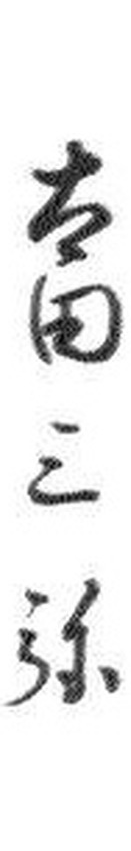太田三弥
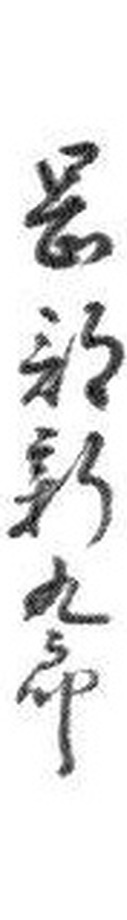岡部新九郎

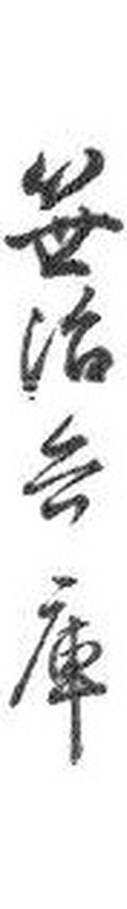笹治兵庫
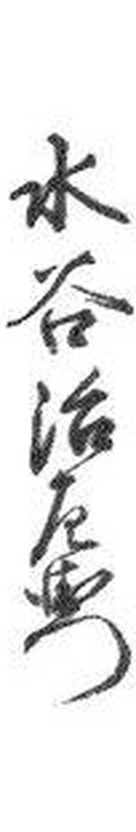水谷治左衛門
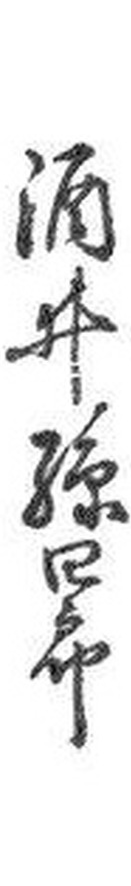酒井孫四郎
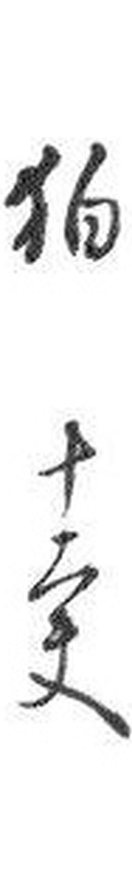狛十大夫
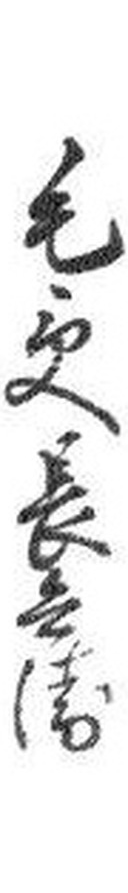毛受長兵衛
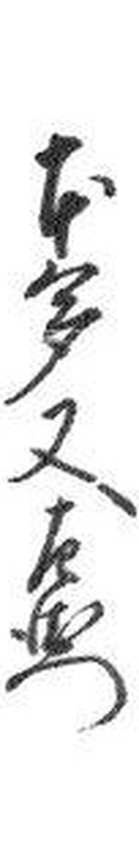本多又左衛門
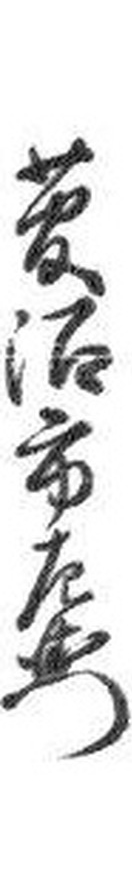菅沼市左衛門
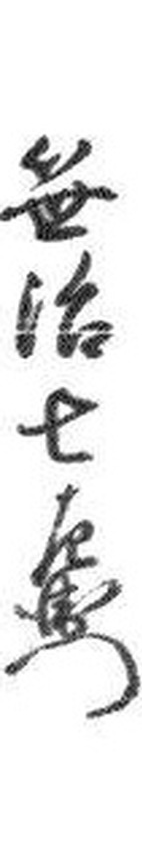笹治七左衛門
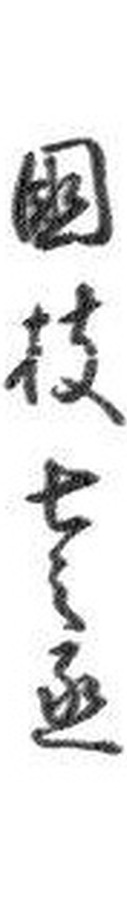国枝七之丞
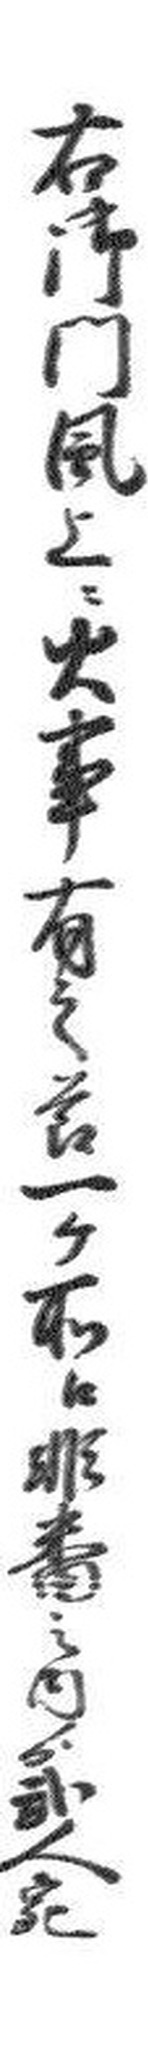右御門風上ニ火事有之節一ケ所江非番之内ゟ弐人宛
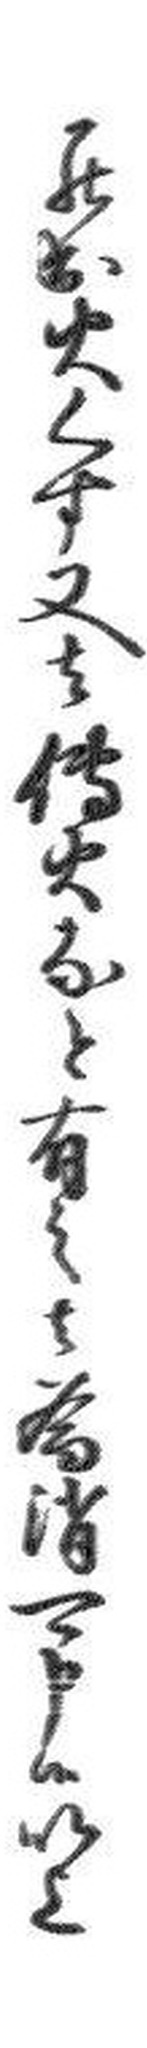罷出火くす又者伝火なと有之者為消可申候以上
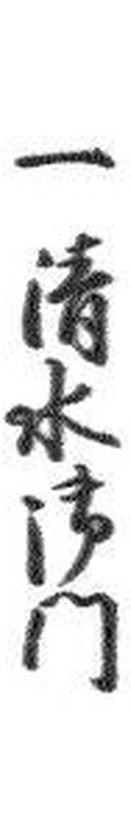一清水御門
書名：家譜 八 光通公 従寛文十年到同十二年
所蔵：福井県文書館 Fukui Prefectural Archives
